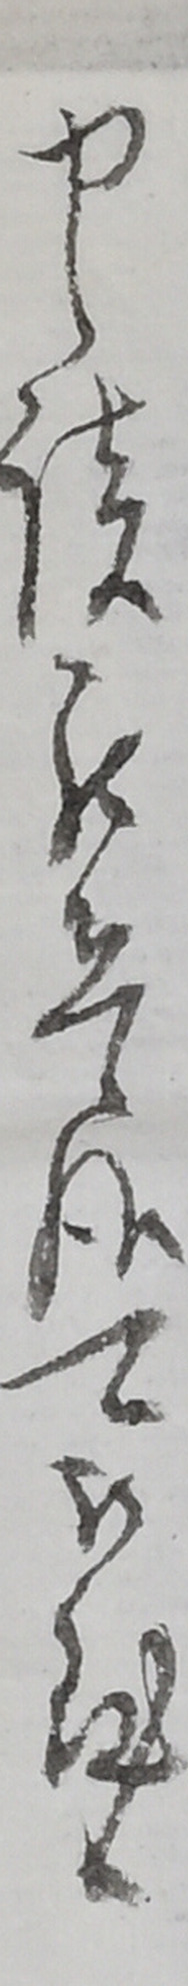申談罷在候様可被致候
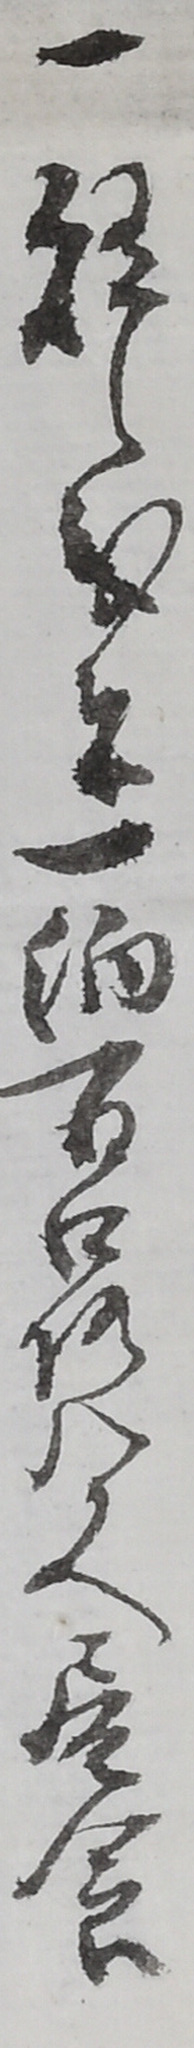一賄之義は一泊百四拾八文昼食
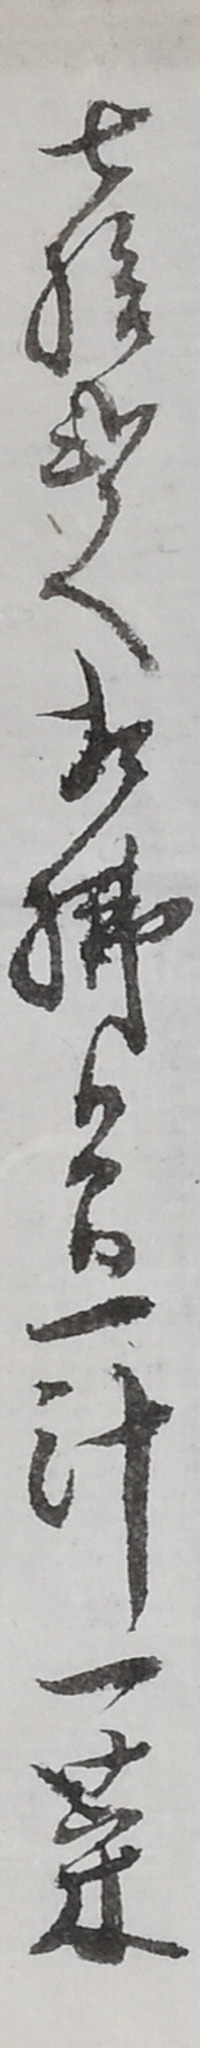七拾弐人相払候間一汁一菜
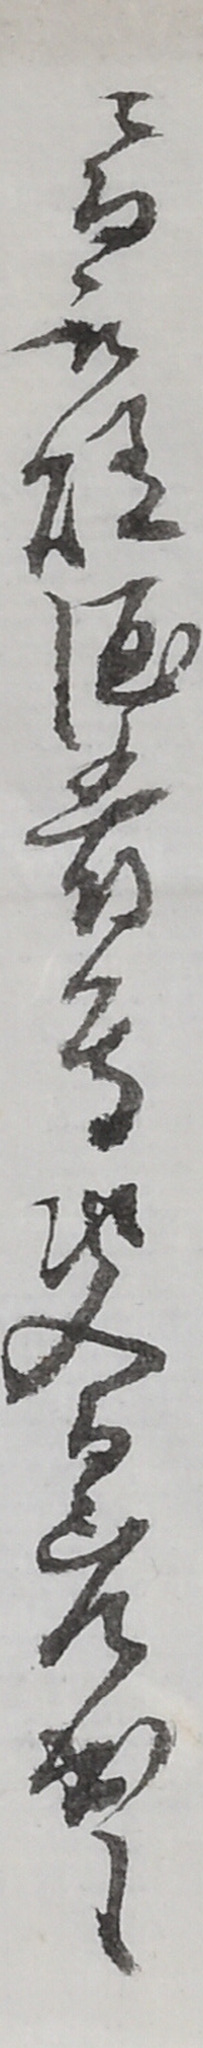ニ而取賄酒肴等決而差出し
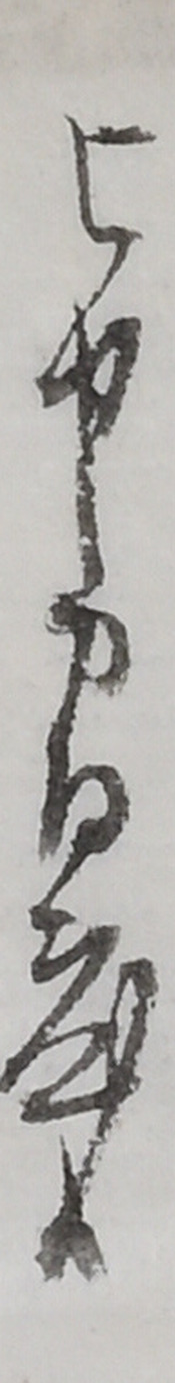被申間敷候
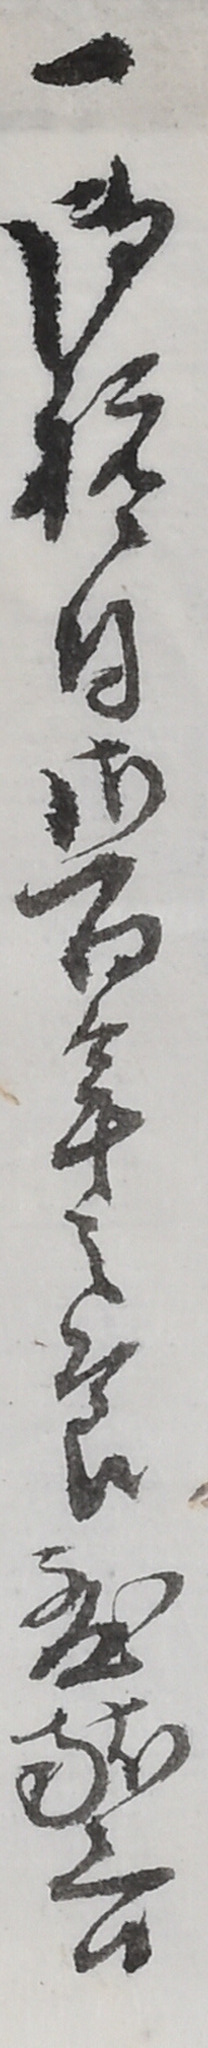一御祝ニ付御百年之節致献上候
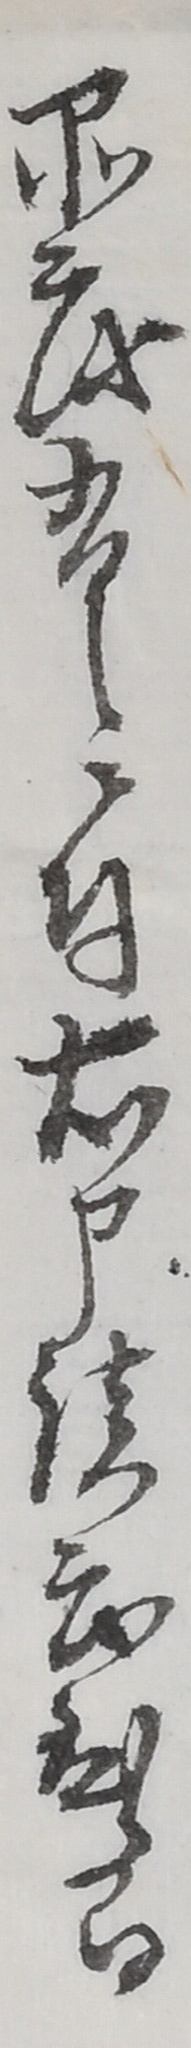品も有之ニ付右申談も致候間
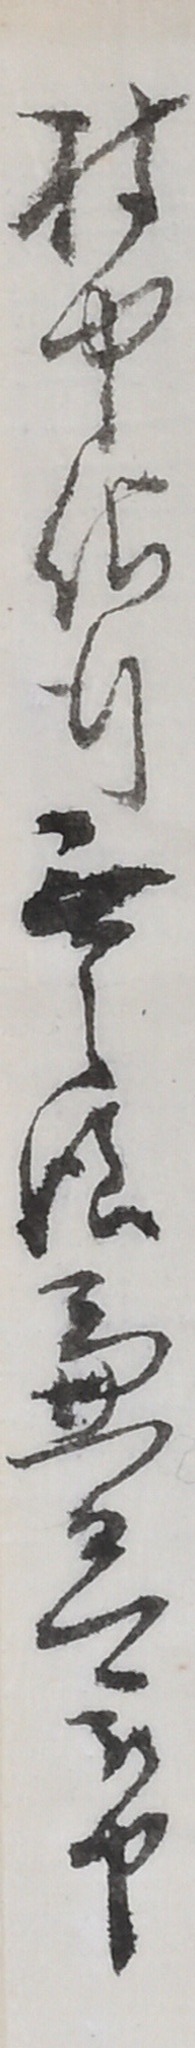村中他行無之様兼而可被申
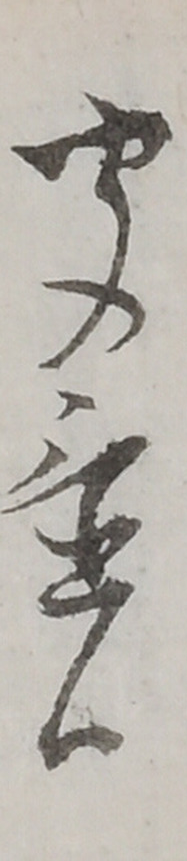聞置候
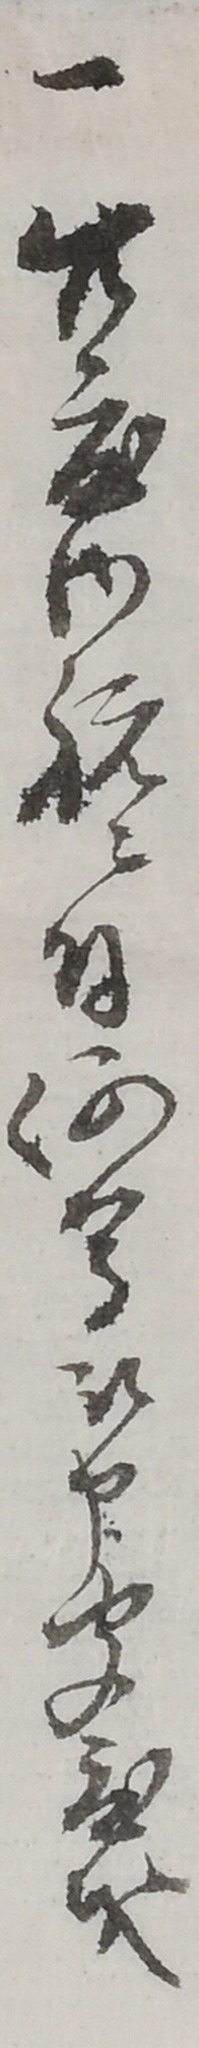一此度御祝ニ付何等被申聞置義
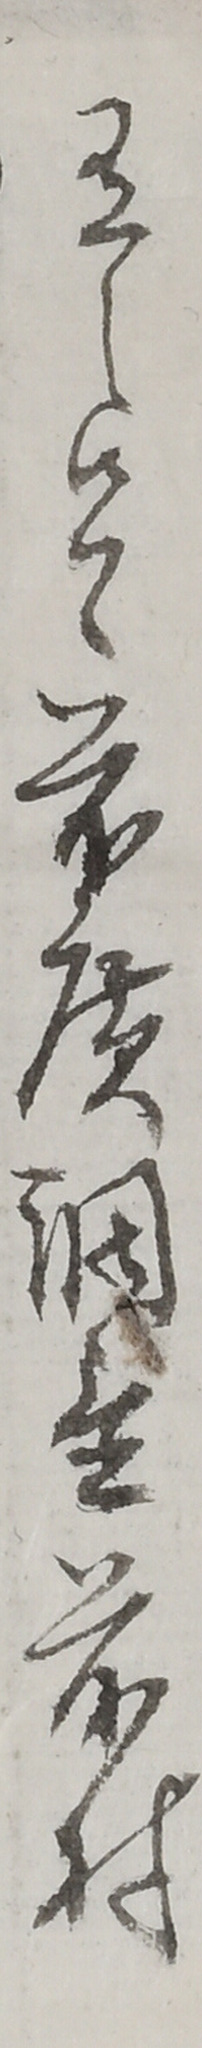有之候ハヽ前広調置前村
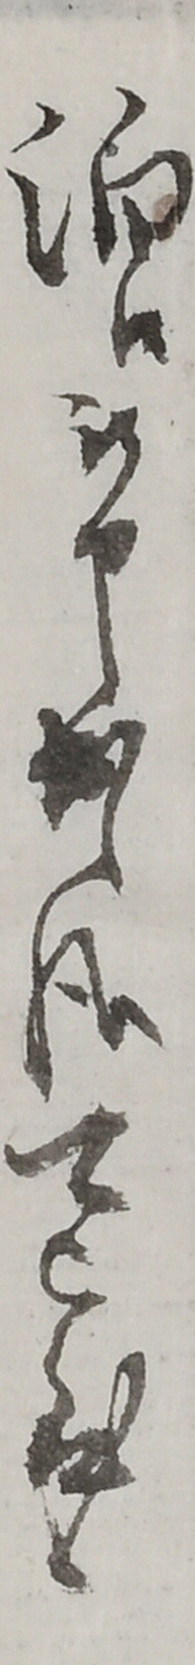泊候被申出候様可被致候
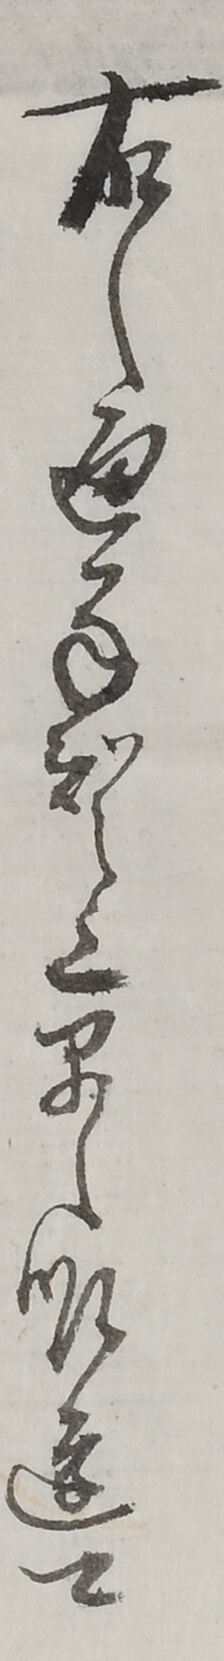右之通承知之上早々順達可
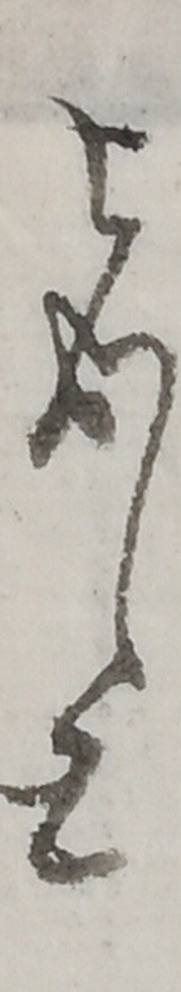被成候以上
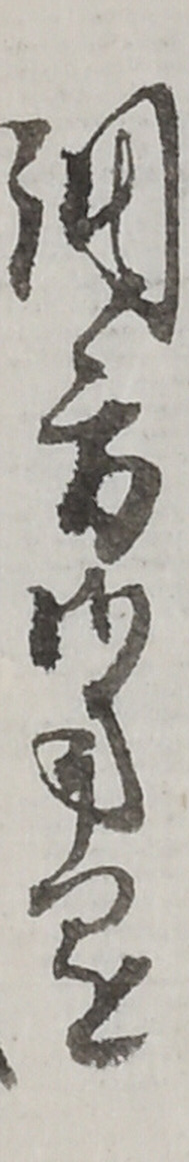調方御用懸
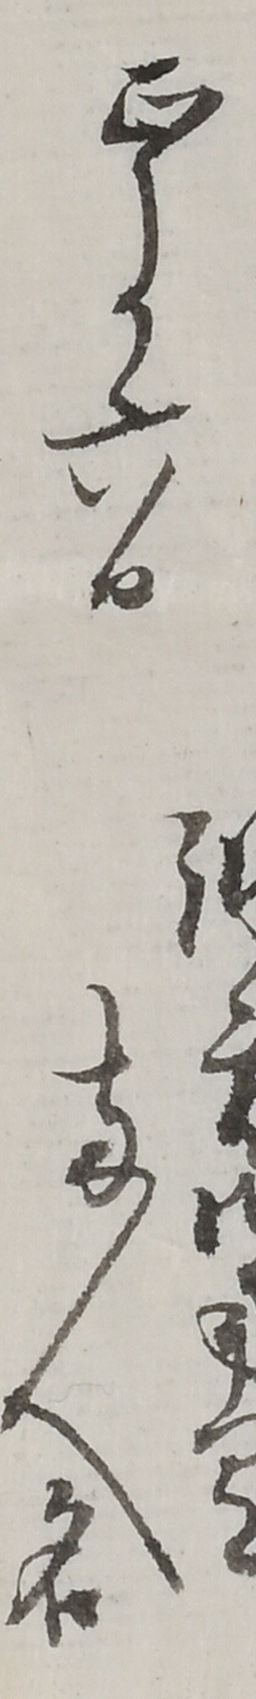正月六日両人名
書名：百五拾年御祝御用手控
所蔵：伊那市立高遠町図書館・合同会社AMANE
